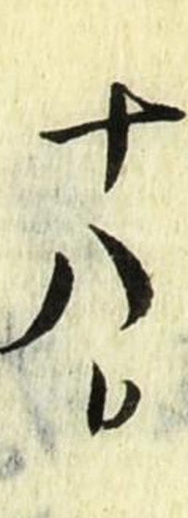十八日
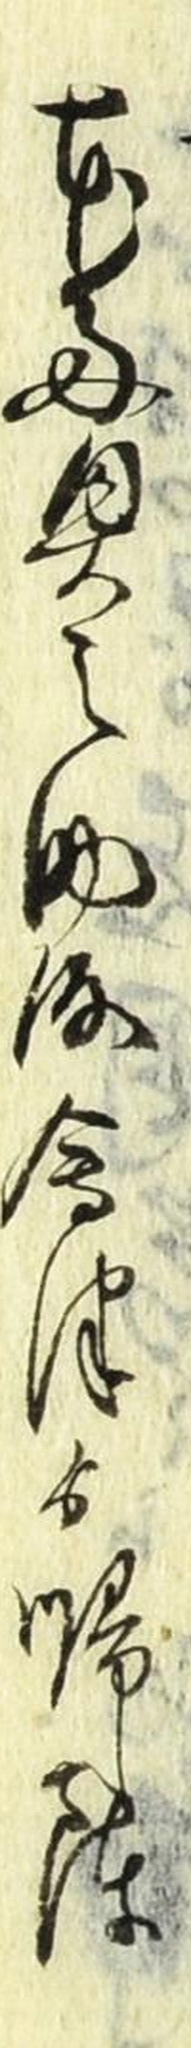本多興之助殿会津ゟ帰陣
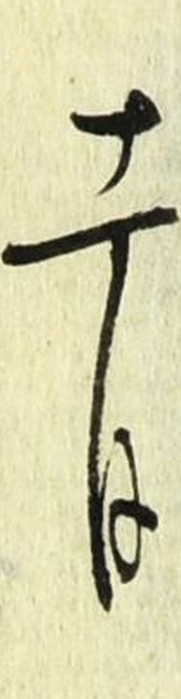十一月
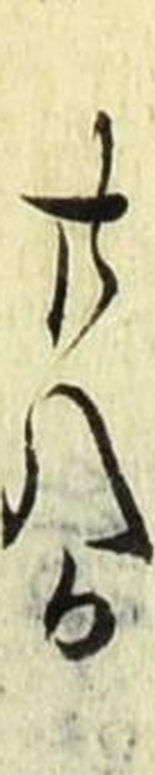廿八日
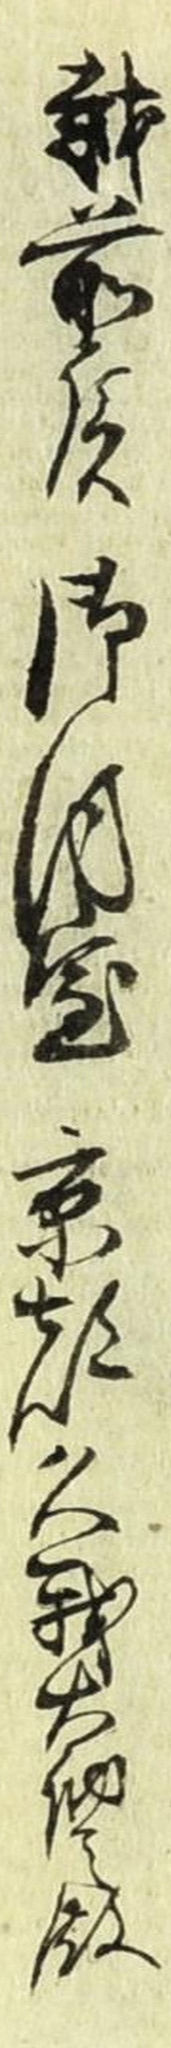越前侯御内室京都久我大納言殿
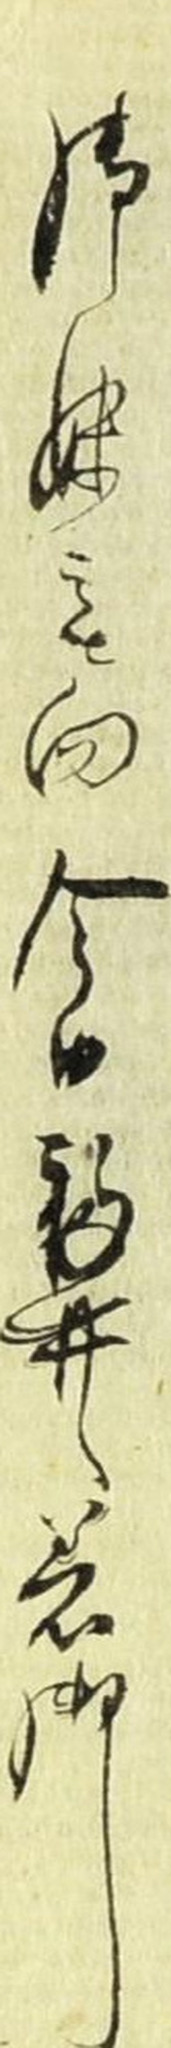御妹被向今日福井へ着御

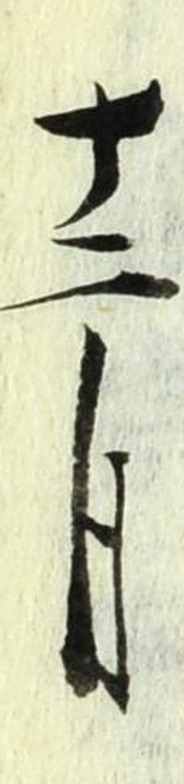十二月
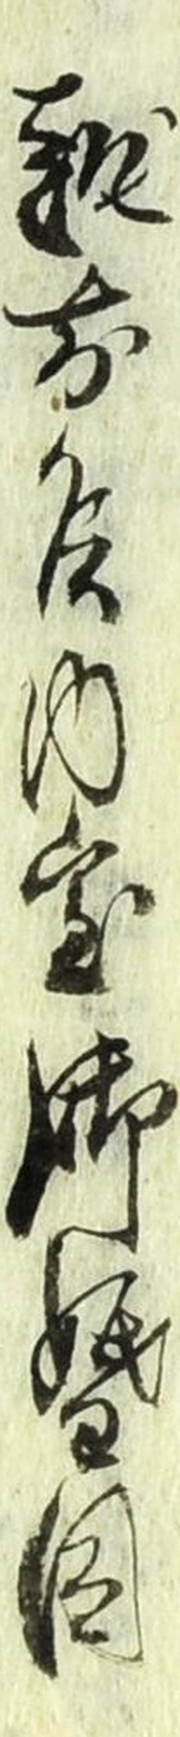越前侯内室御婚因
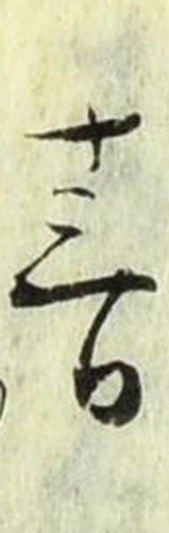十三日
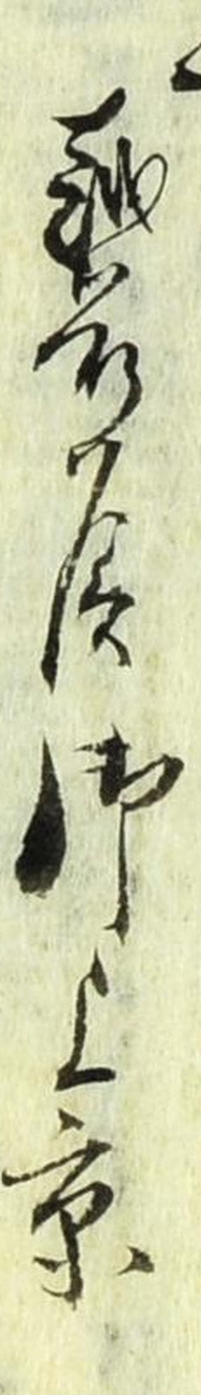越前侯御上京
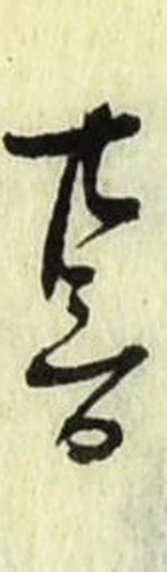廿三日
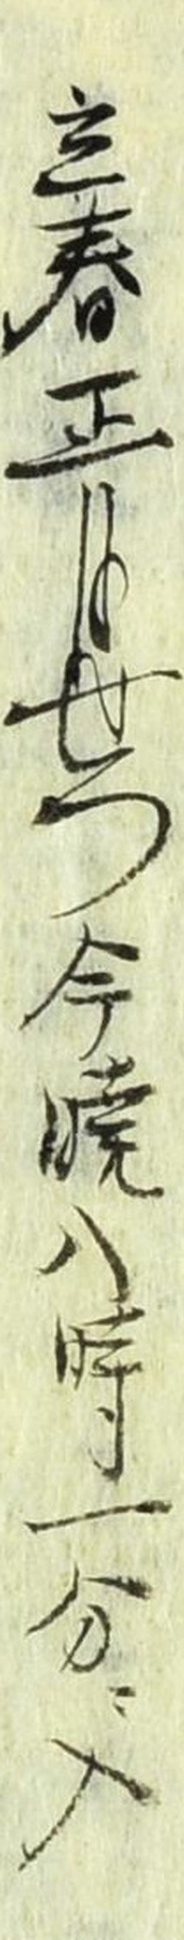立春正月せつ今暁八時一分に入
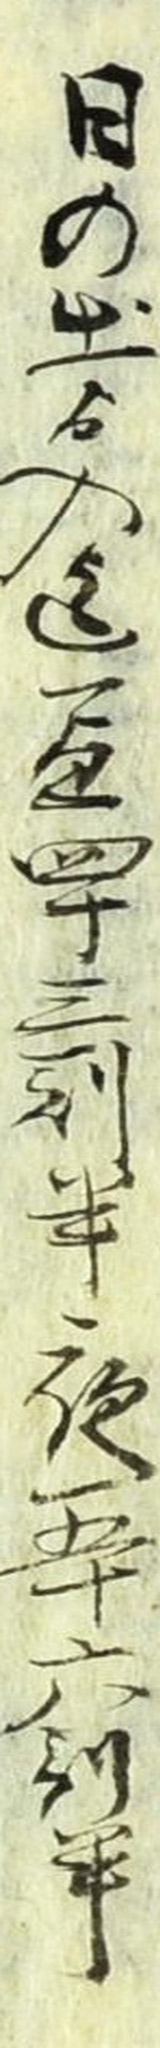日の出ゟ入迄昼四十三刻半夜五十六刻半
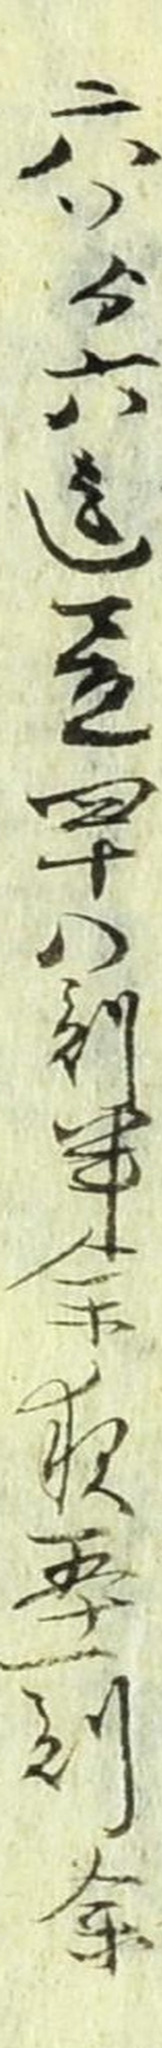六ツゟ六迄昼四十八刻半余夜五十一刻余
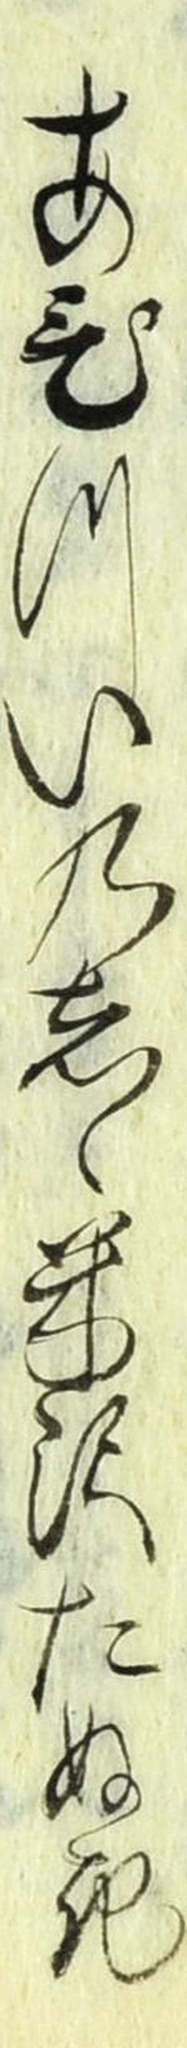あひついのしゝ米沢たぬき
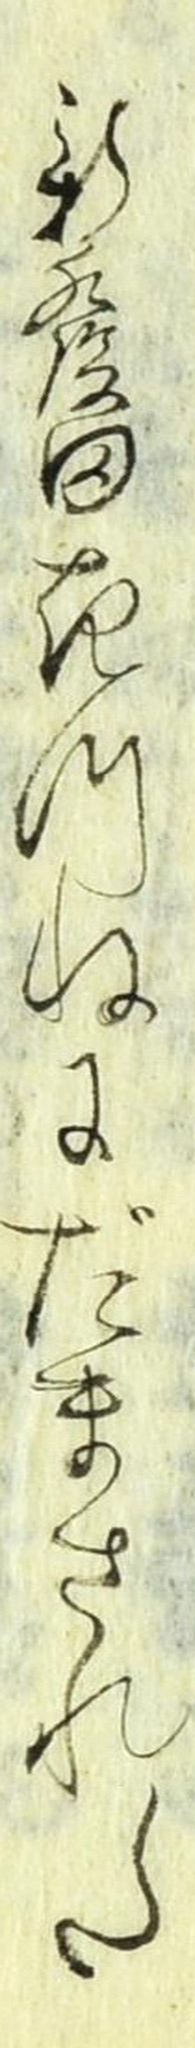新発田きつねにだまされた
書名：（日記）
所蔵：福井県文書館 Fukui Prefectural Archives
